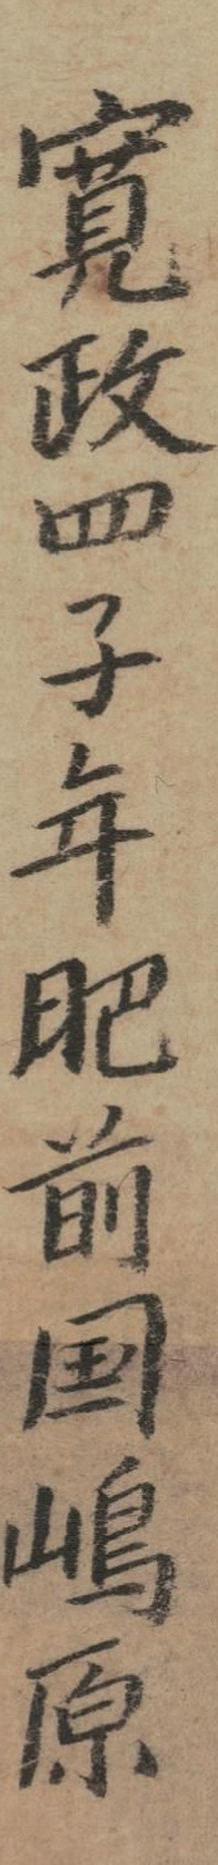寛政四子年肥前国嶋原
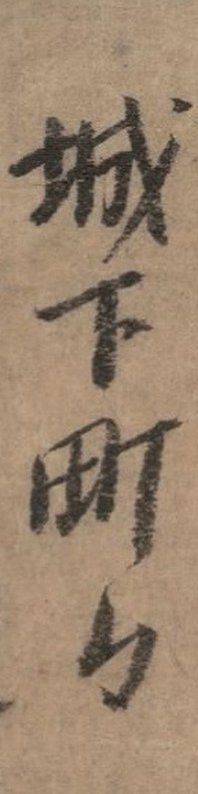城下町々
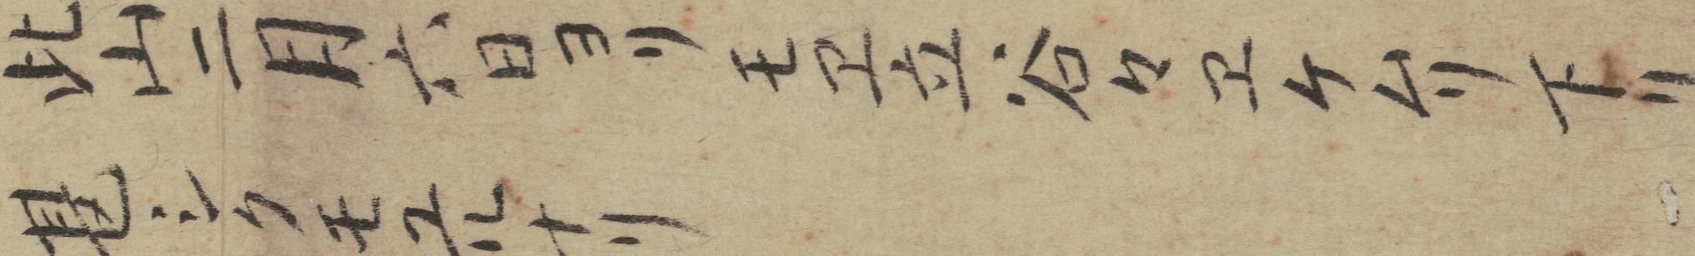此山二月六日ヨリモエ立谷々エケムリ下リ
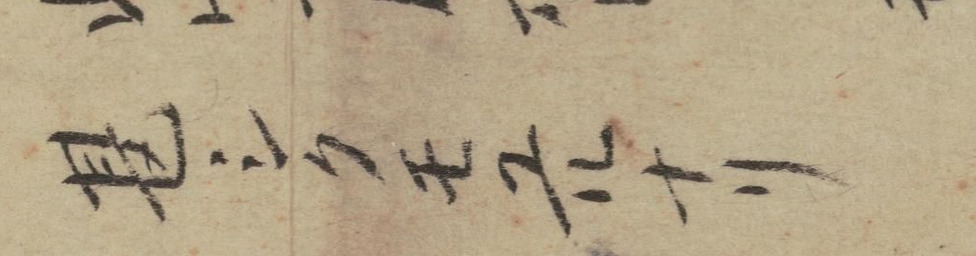甚シクモエルナリ
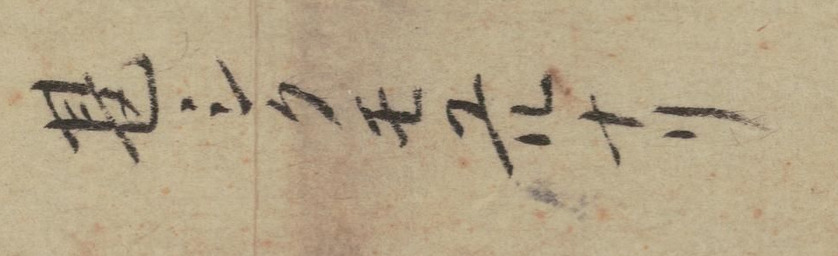甚シクモエルナリ
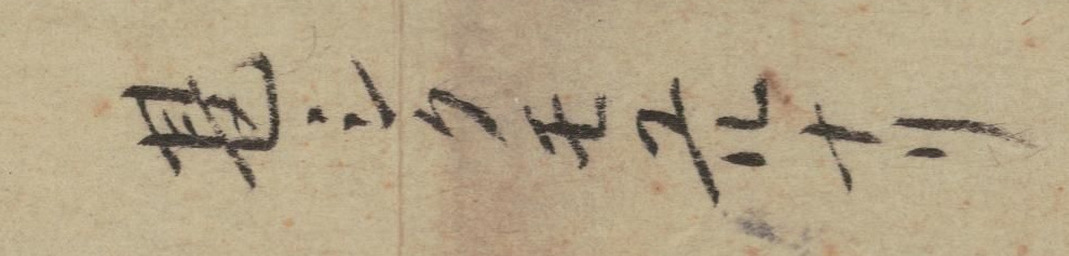甚シクモエルナリ
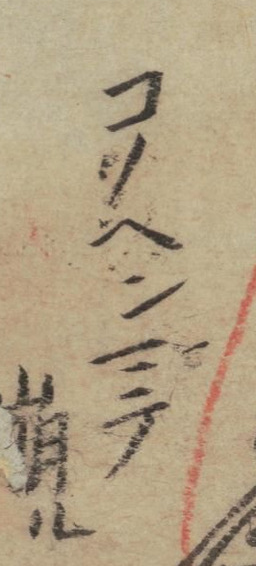コノヘンマテ海
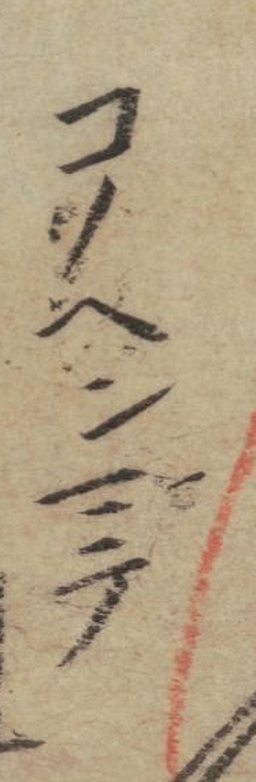コノヘンマテ海
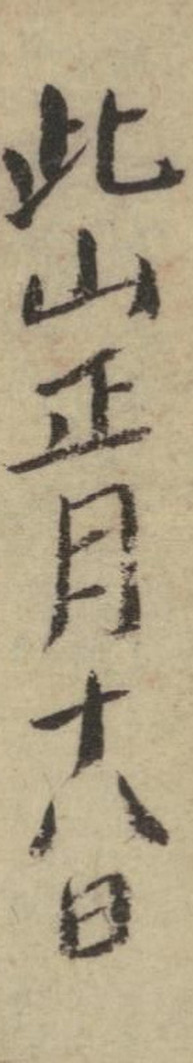此山正月十八日
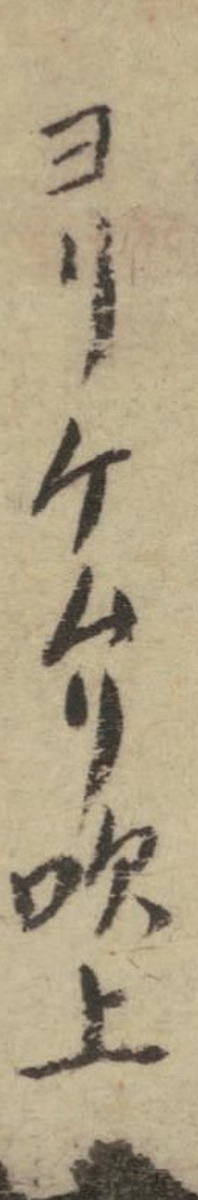ヨリケムリ吹上
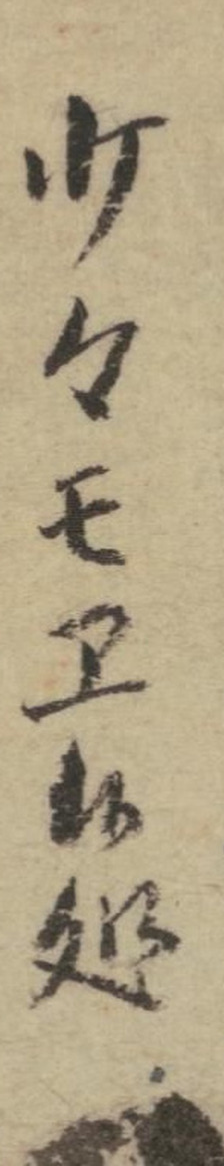少々モエ候処
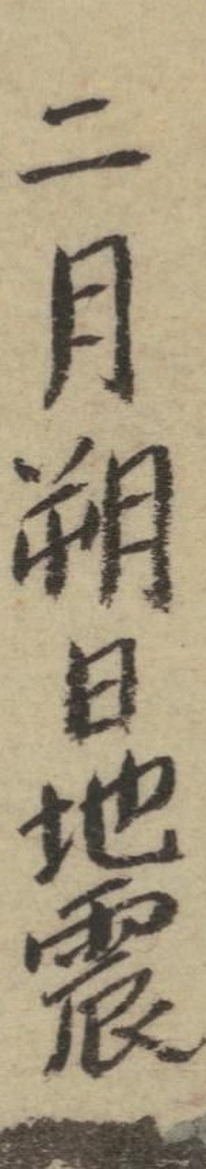二月朔日地震
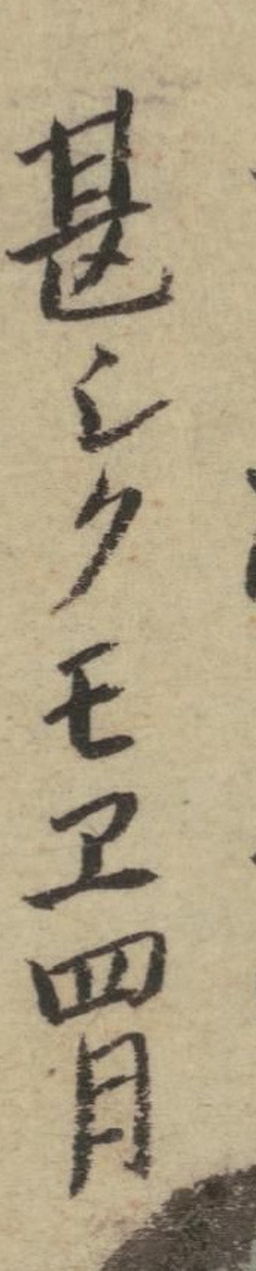甚シクモエ四月
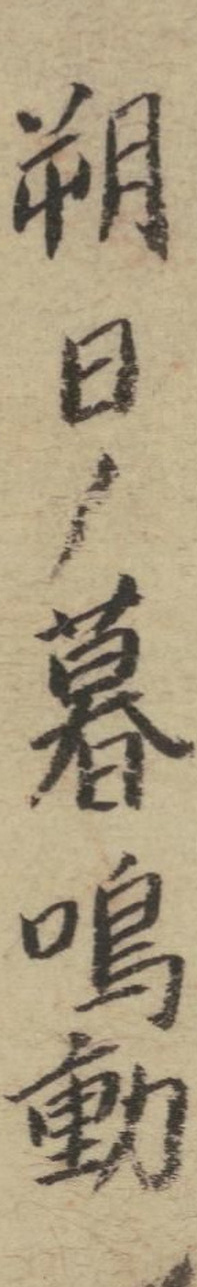朔日ノ暮鳴動
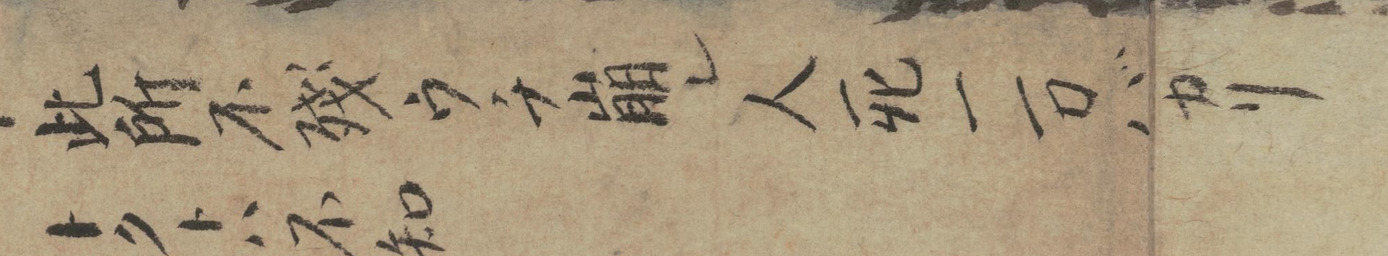此所不残ウチ崩レ人死一一〇バカリ
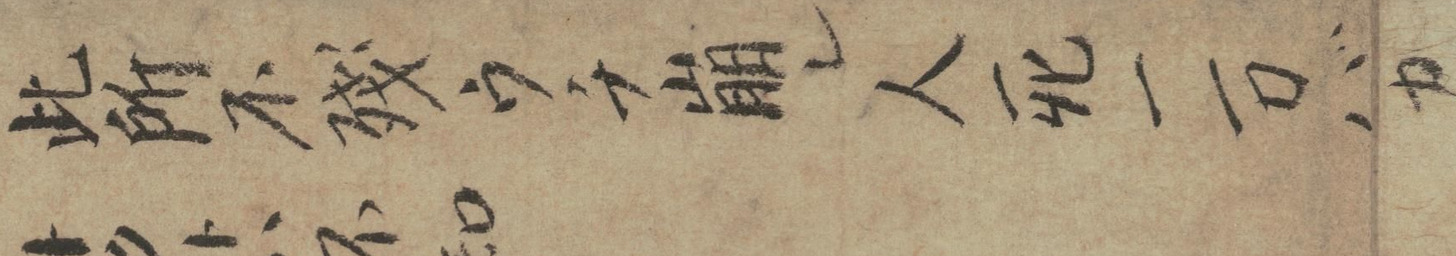此所不残ウチ崩レ人死一一〇バカリ
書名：寛政四子年肥前国嶋原山々燃崩城下町々村々破損ノ圖
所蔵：東京大学地震研究所図書室 Earthquake Research Institute Library, The University of Tokyo, JAPAN
